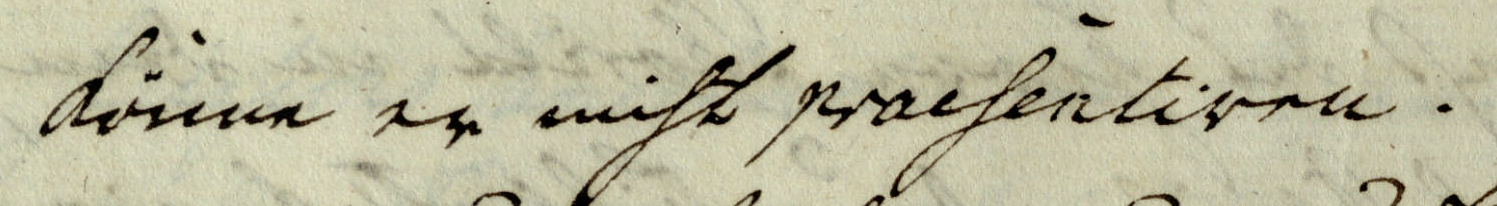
könne er nicht praesentiren.
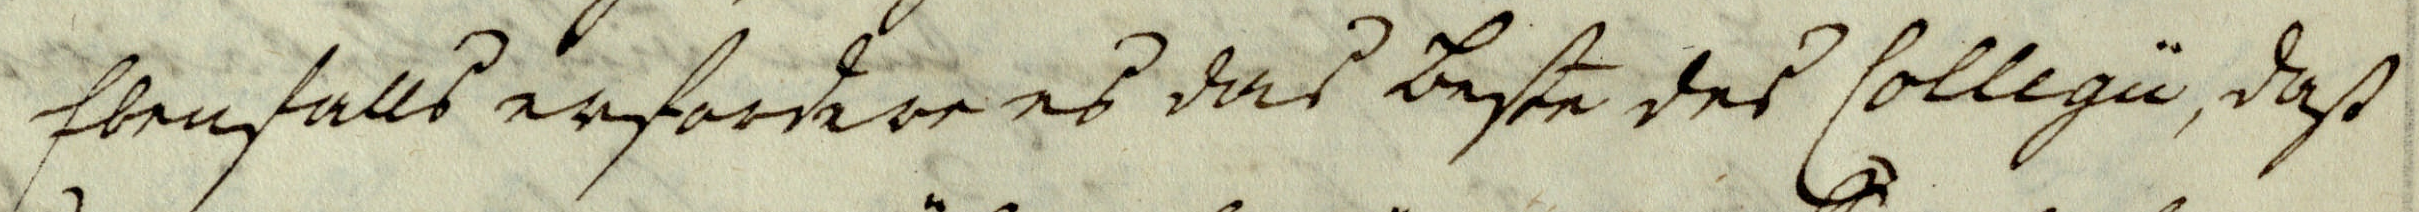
Ebenfalls erfordere es das Beste des Collegii, daß
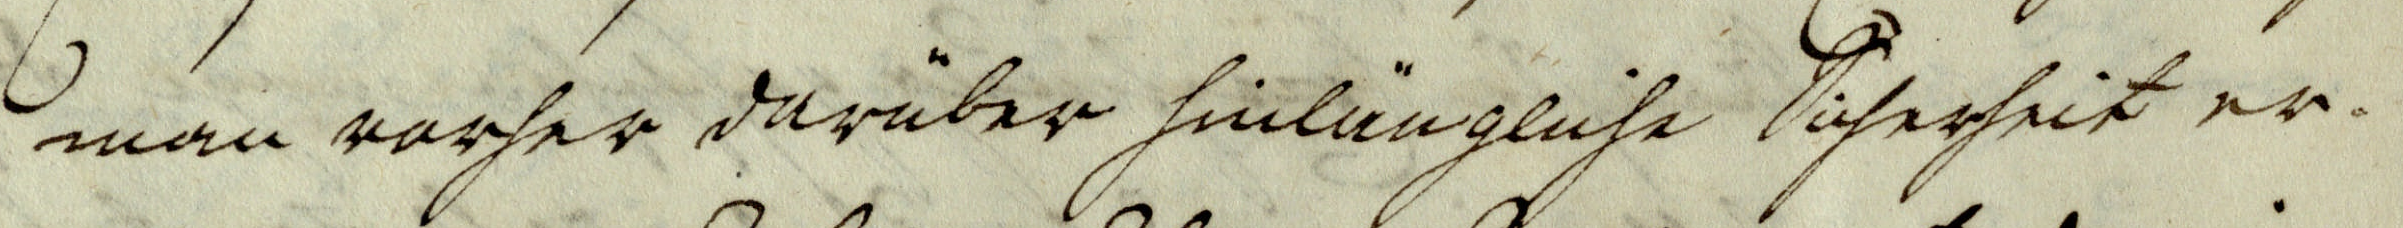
man vorher darüber hinlänglich Sicherheit er¬
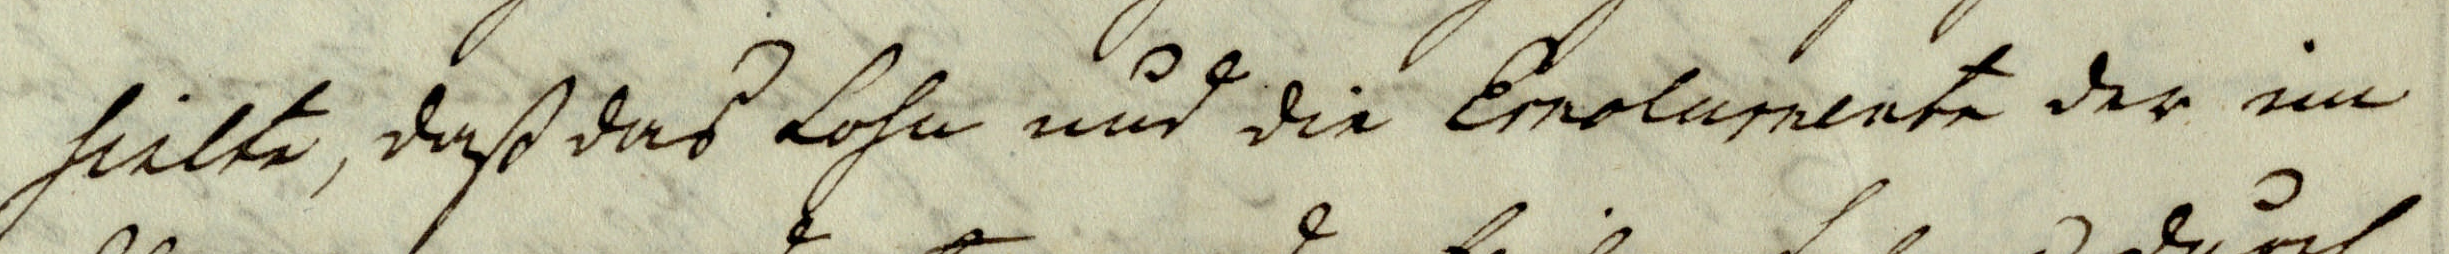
hielte, daß das Lohn und die Emolumente der im
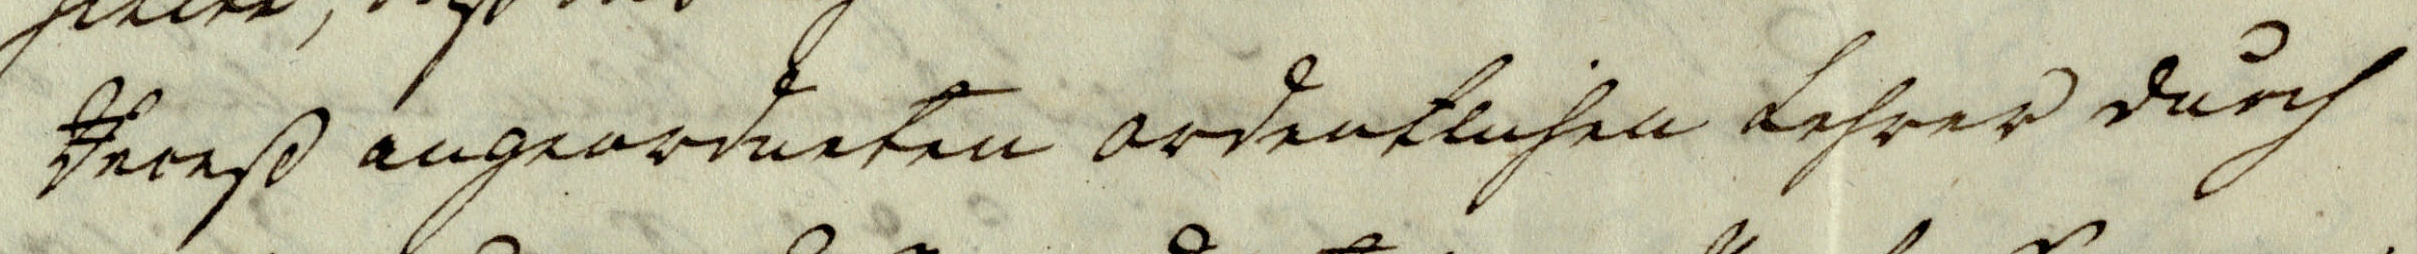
Receß angeordneten ordentlichen Lehrer durch
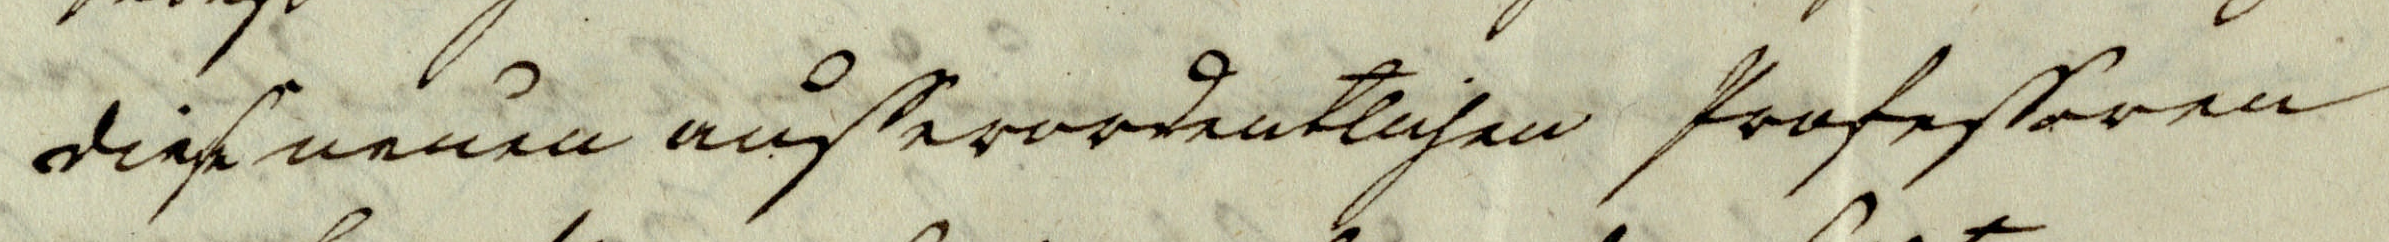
diese neuen ausserordentlichen Professoren
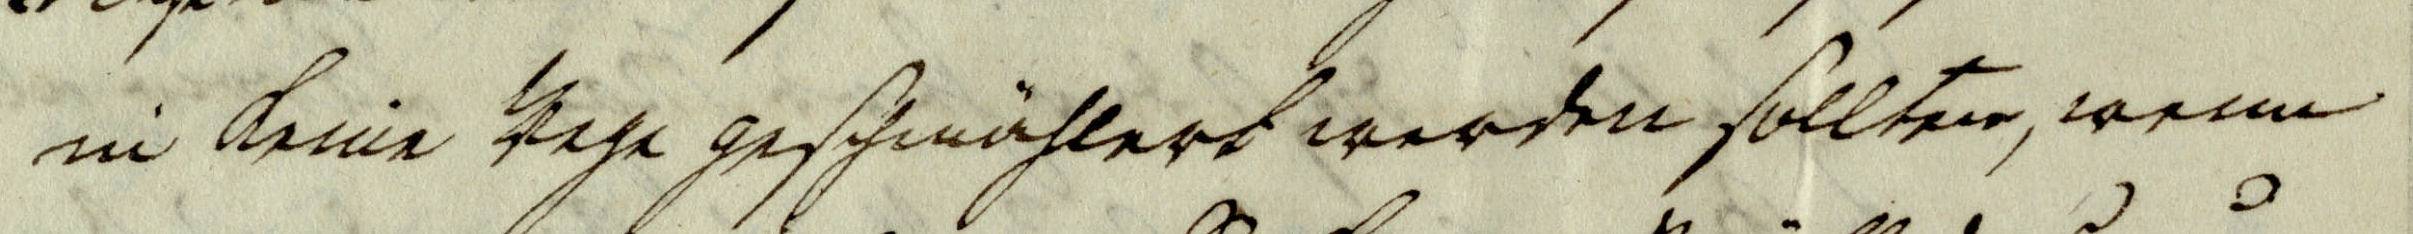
in keine Wege geschmählert werden sollten, wenn
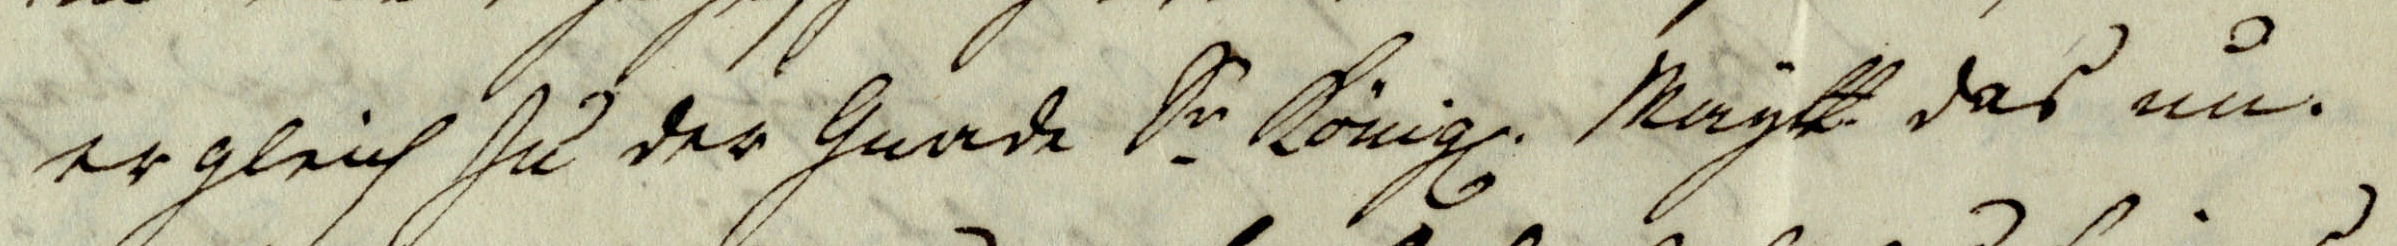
er gleich zu der Gnade Sr. Königl. Maÿst. das un¬
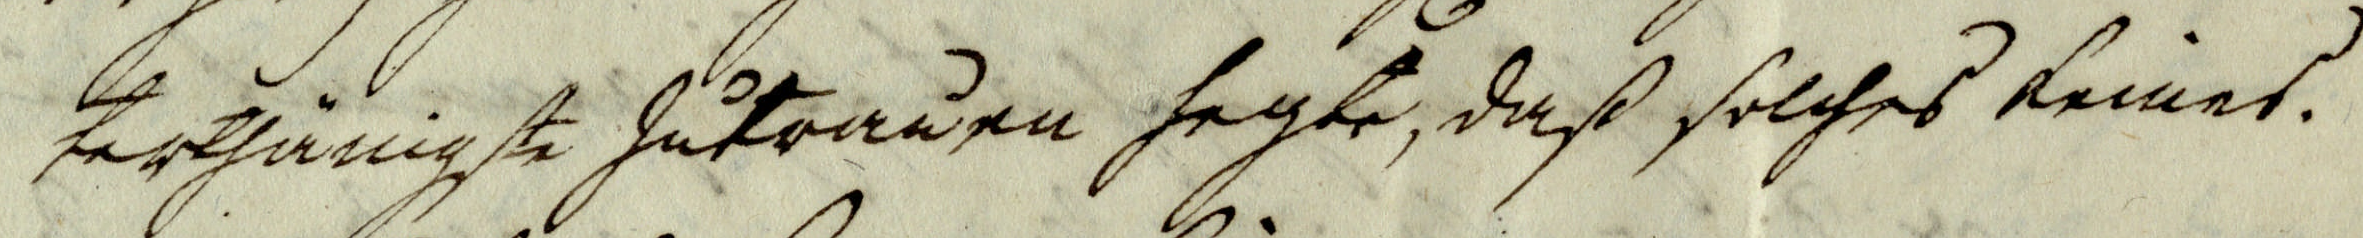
terthänigste Zutrauen hegte, daß solches keines¬
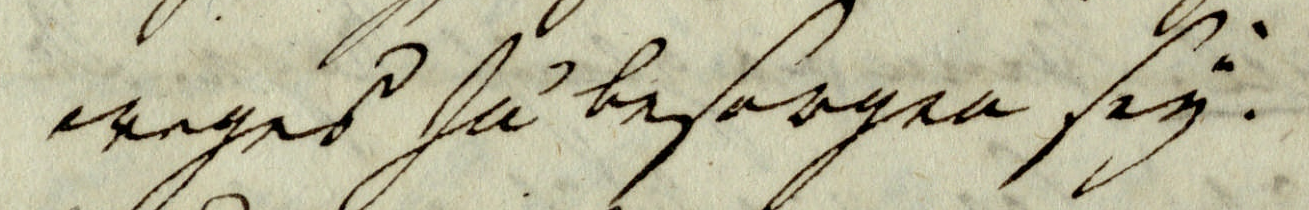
weges zu befragen seÿ.
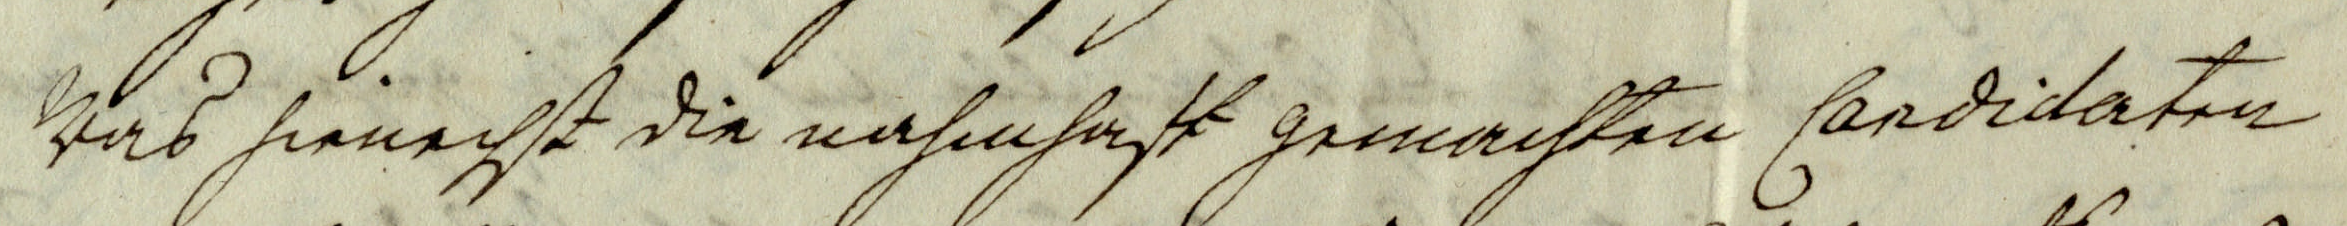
Was hienechst die nahmhaft gemachten Candidaten
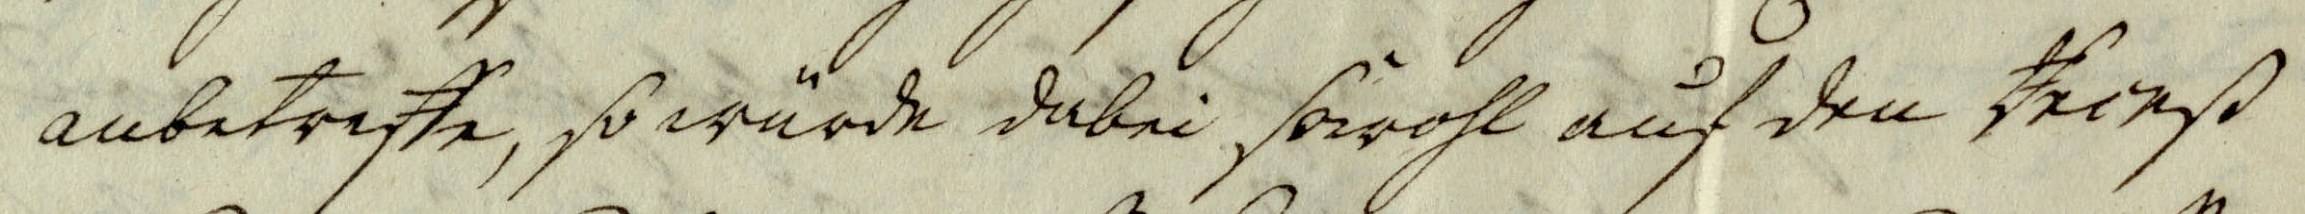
anbetreffe, so würde dabei sowohl auf den Receß
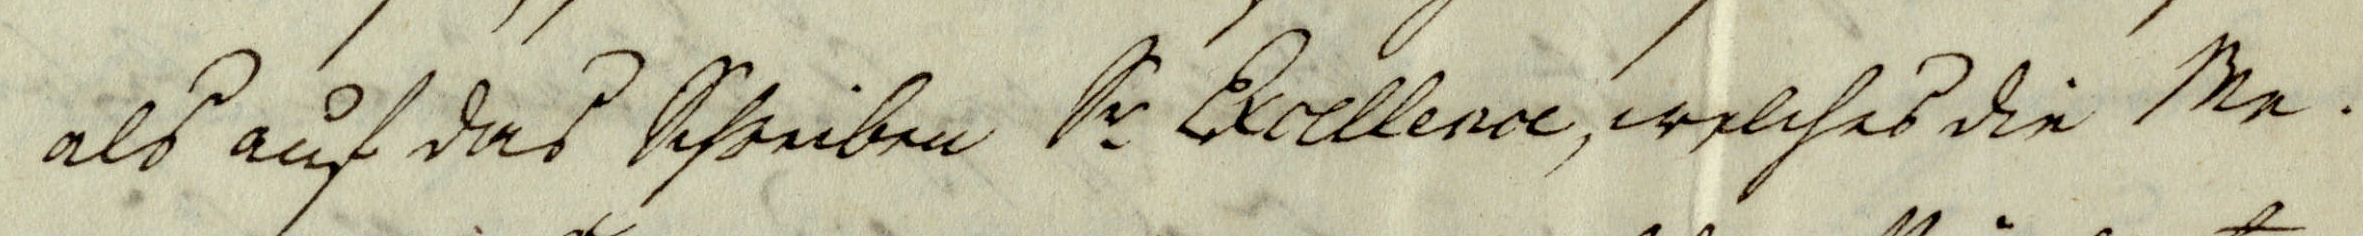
als auf das Schreiben Sr. Excellence, welches die Me¬
